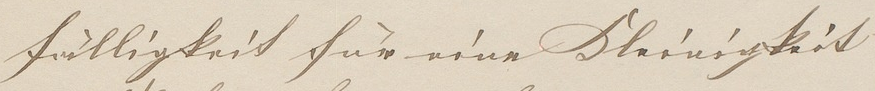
fälligkeit für eine Kleinigkeit
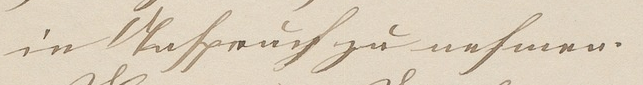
in Anspruch zu nehmen.
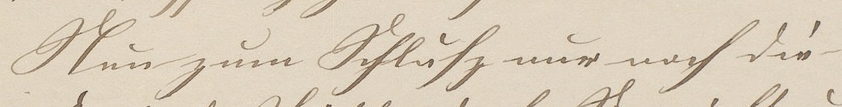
Nun zum Schlusz nur noch die
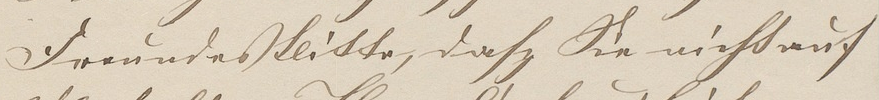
Freundes Bitte, dasz Sie nicht auf
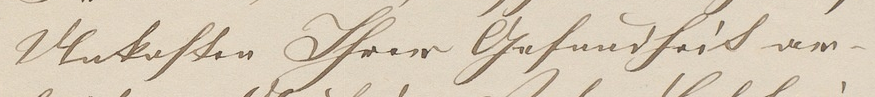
Unkosten Ihrer Gesundheit ar-
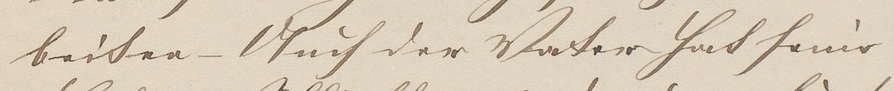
beiten – Auch der Vater hat seine
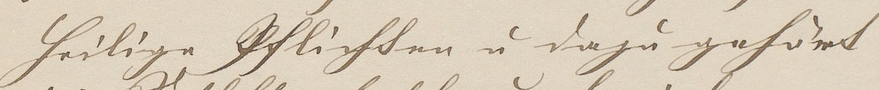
heilige Pflichten u dazu gehört
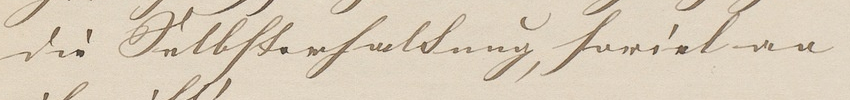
die Selbsterhaltung, soviel an
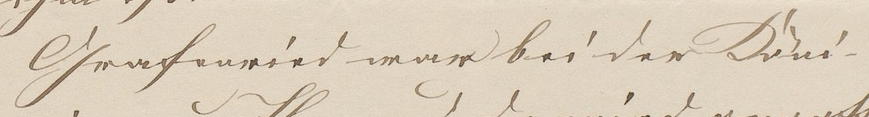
Grafenried war bei der Köni-
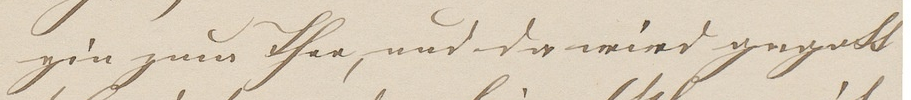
gin zum Thee, und da wird gegott-
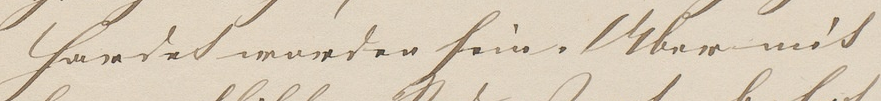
hardet worden sein. Aber mit
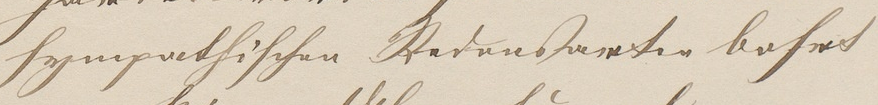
sympatischen Redensarten bohrt
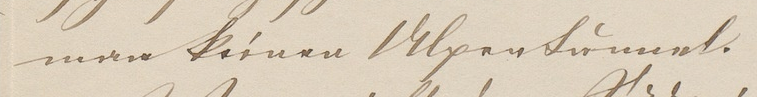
man keinen Alpentunnel.
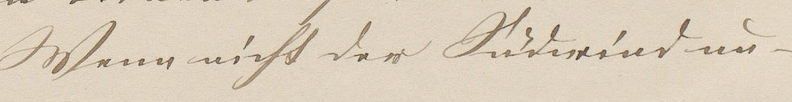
Wenn nicht der Südwind un-
